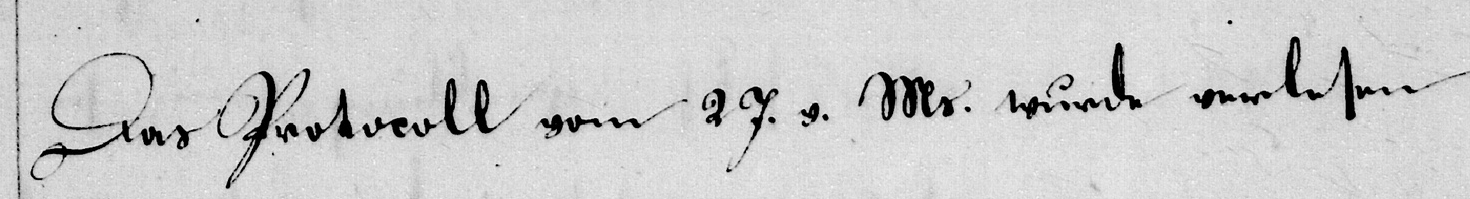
Das Protocoll vom 27. v. Ms. wurde verlesen
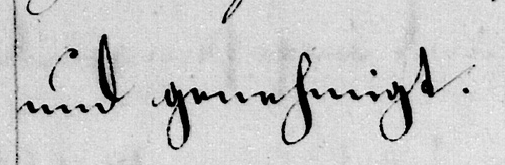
und genehmigt.
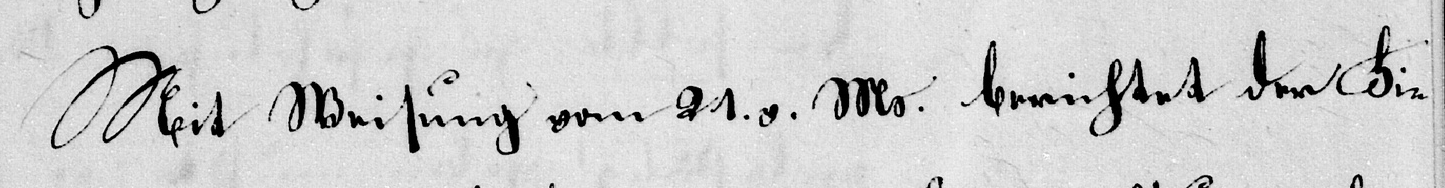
Mit Weisung vom 21. v. Ms. berichtet der Fi¬
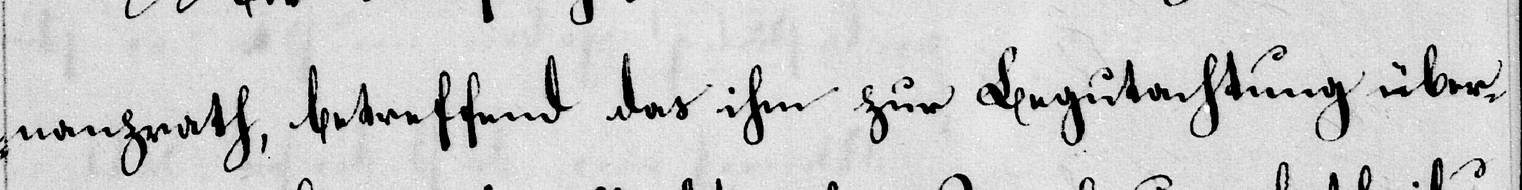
nanzrath, betreffend das ihm zur Begutachtung über¬
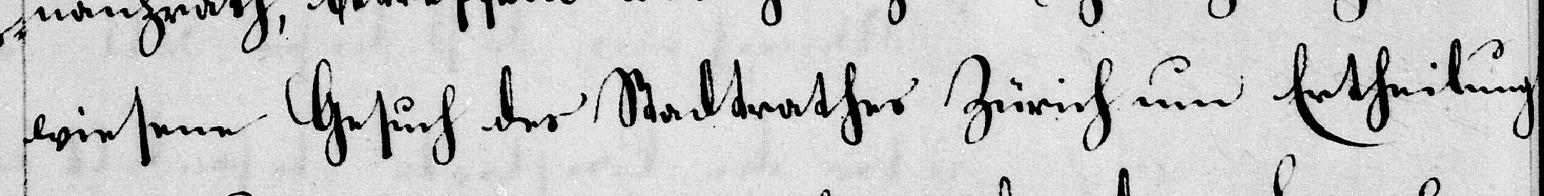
wiesene Gesuch des Stadtrathes Zürich um Ertheilung
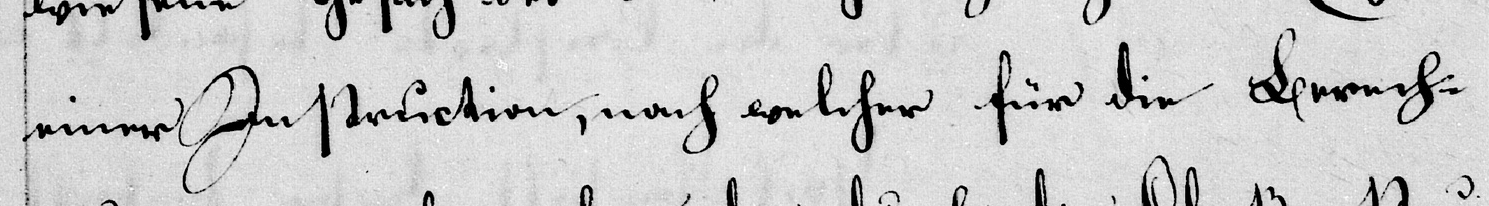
einer Instruction, nach welcher für die Berech¬
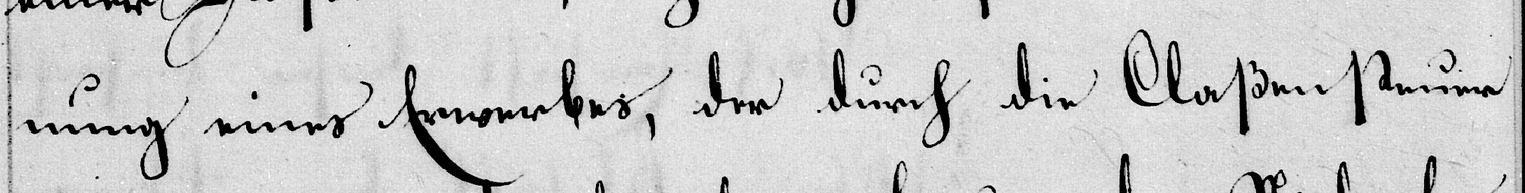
nung eines Erwerbes, der durch die Claßensteuer
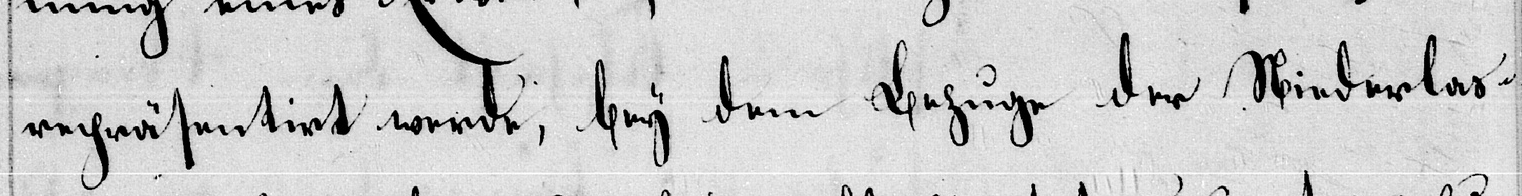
repräsentirt werde, bey dem Bezuge der Niederlaß¬
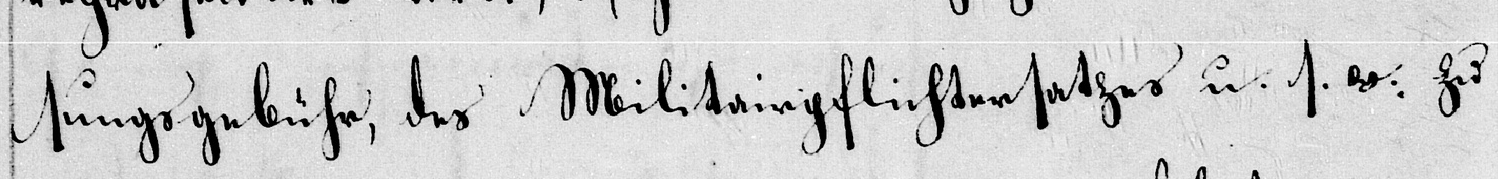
ungsgebühr, des Militairpflichtersatzes u.s.w. zu
